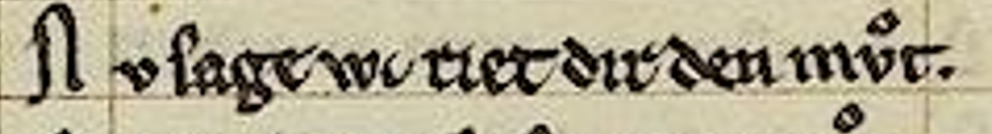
Nv ſage w(az) riet dir den mv°ot.
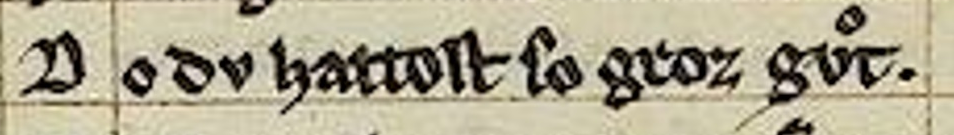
Do dv hattoſt ſo groz gv°ot.
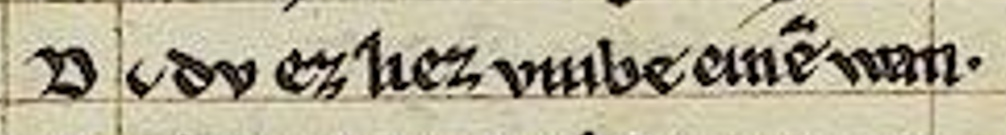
D(az) dv ez liez vmbe eine(n) wan.
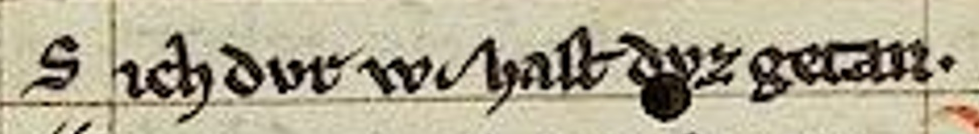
Sich dvr w(az) haſt dvz getan.
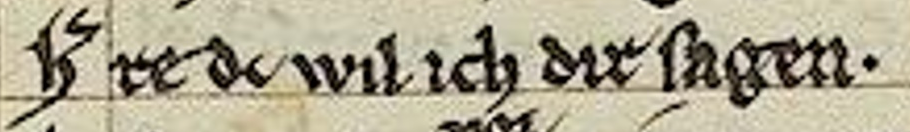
H(er)re d(az) wil ich dir ſagen.
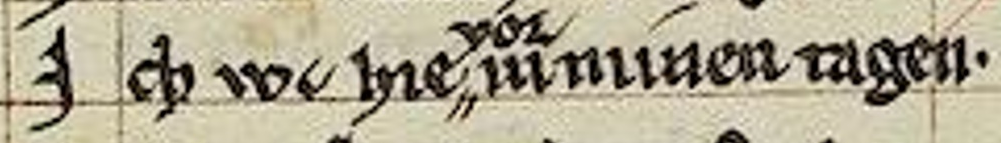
Ich w(az) hie °(vor) in minen tagen.
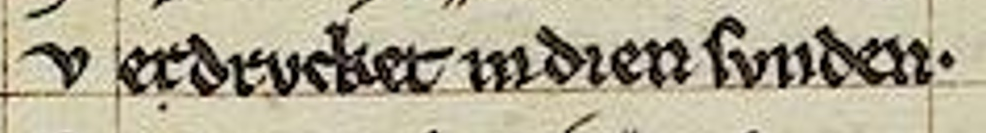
Verdrvcket in dien ſvnden.
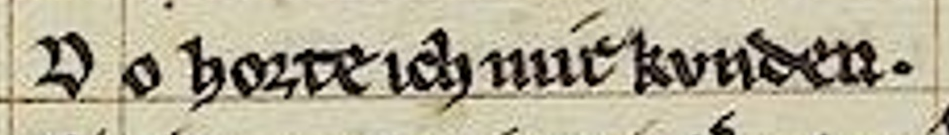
Do horte ich mir kvnden.
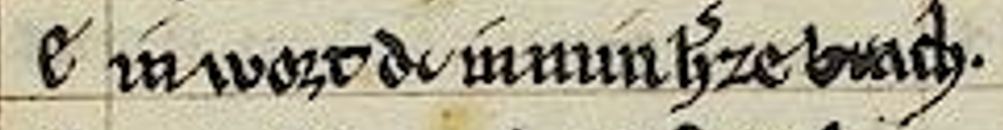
Ein wort d(az) in min h(er)ze brach.
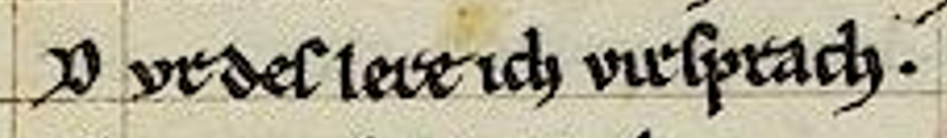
Dvr deſ lere ich virſprach.
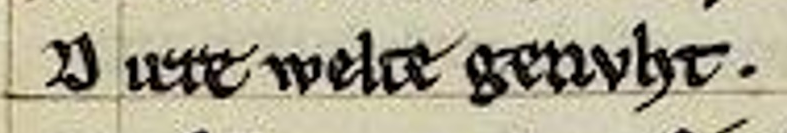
Dirre welte genvht.
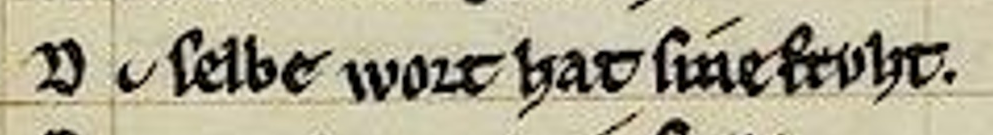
D(az) ſelbe wort hat ſine frvht.
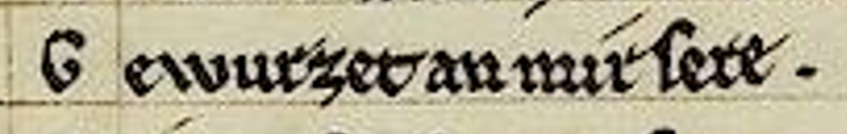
Gewurzet an mir ſere.
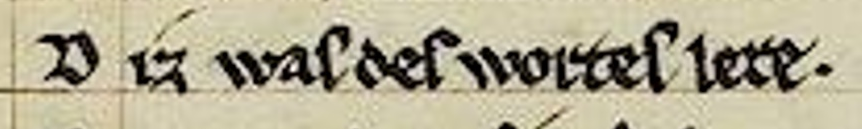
Diz waſ deſ worteſ lere.
